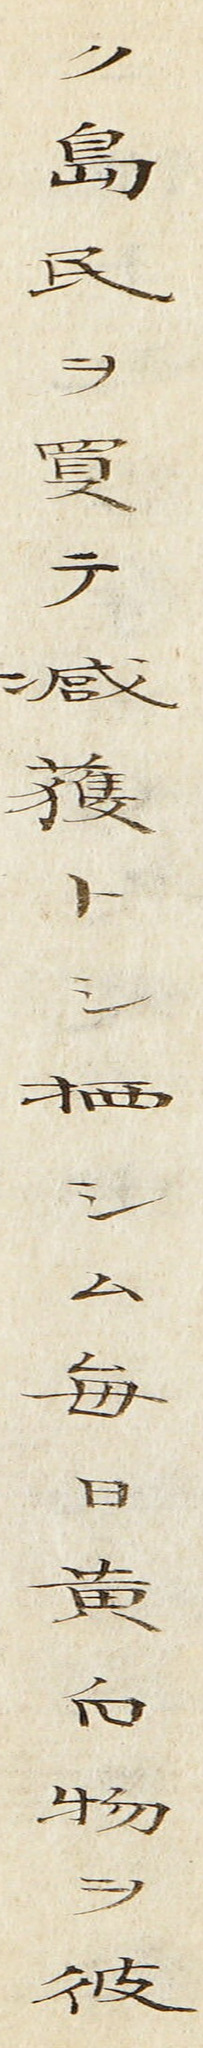ク島民ヲ買テ獲トシ栖シム毎日黄白物ヲ彼
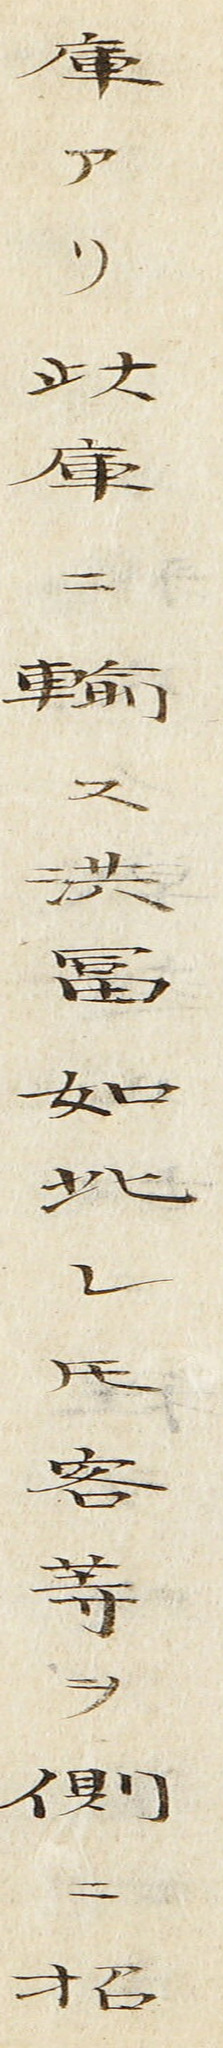庫アリ此庫ニ輸ス洪富如此レトモ客等ヲ側ニ招
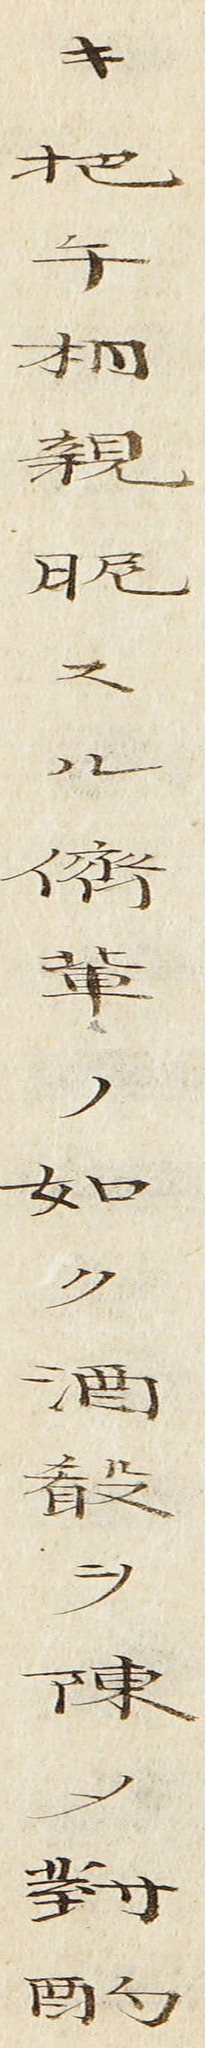キ把午相親昵スル儕輩ノ如酒殽ヲ陳シテ対酌
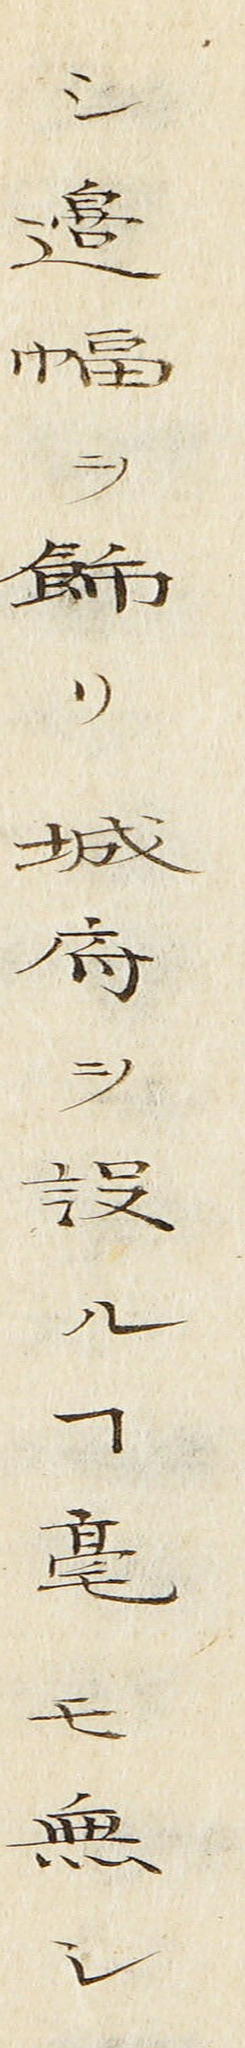シ辺幅ヲ飾リ城府ヲ設ルコト毫モ無シ
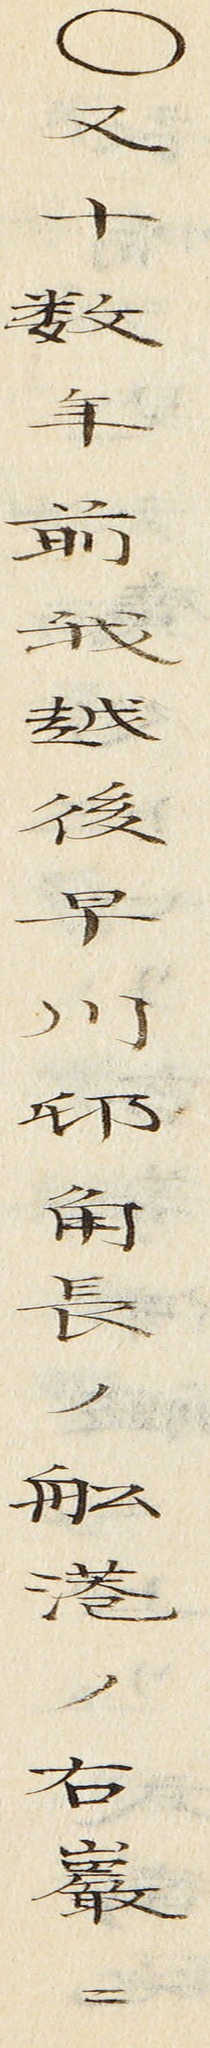○又十数年前我越後早川邸角長ノ舩港ノ右巌ニ
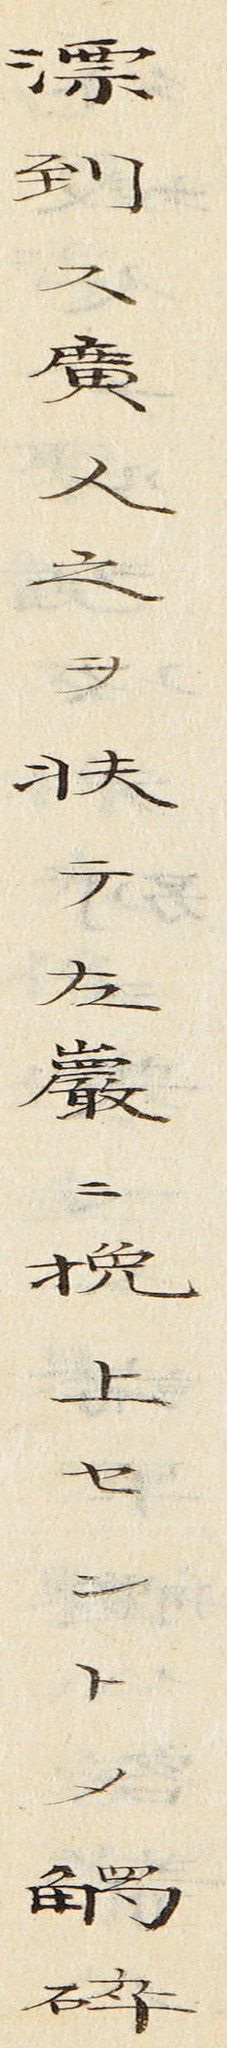漂到ス広人之ヲ扶テ左巌ニ挽上セントシテ触砕
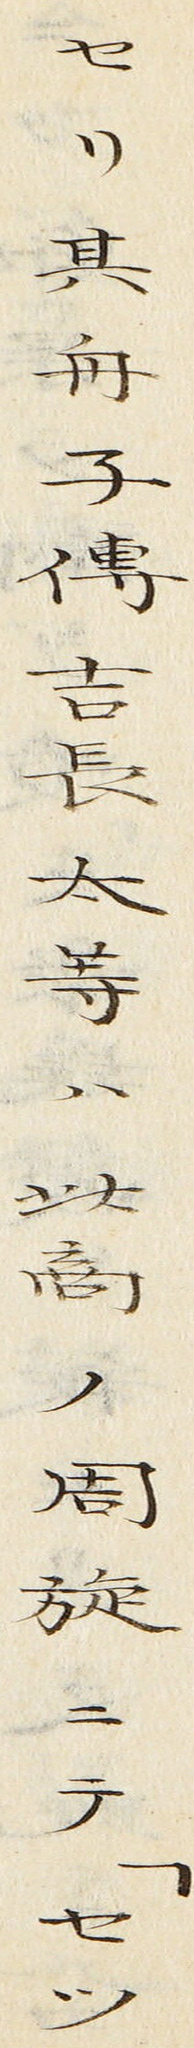セリ其舟子伝吉長太等ハ此商ノ周旋ニテ「セツ
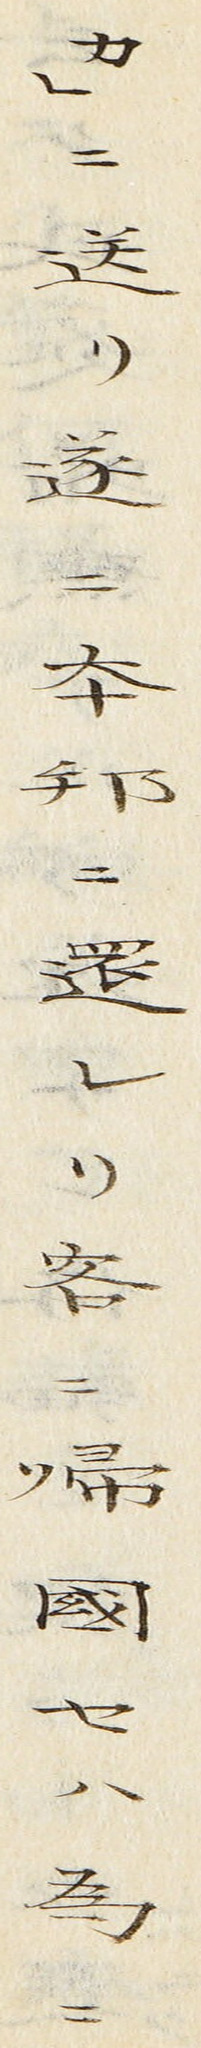カ」ニ送リ遂ニ本邦ニ還レリ客ニ帰国セハ為ニ
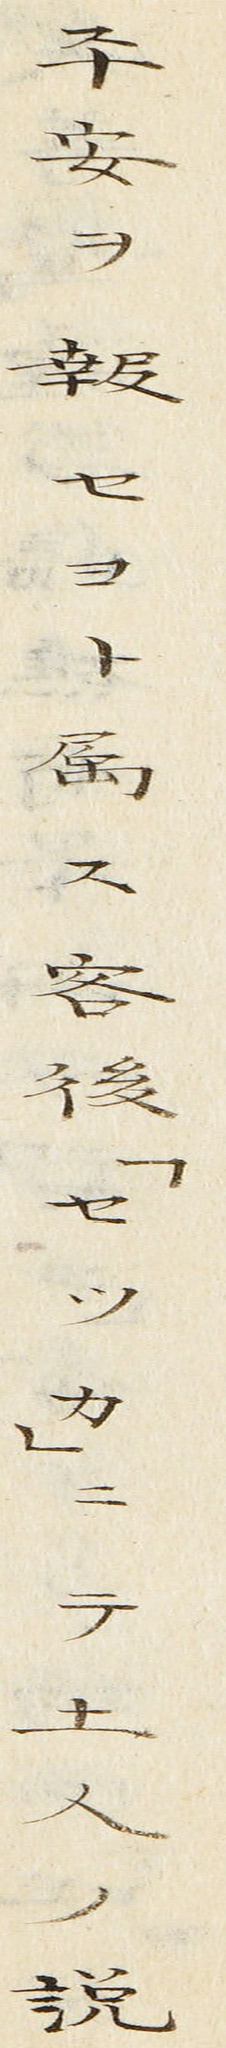平安ヲ報セヨト属ス客後「セツカ」ニテ土人ノ説
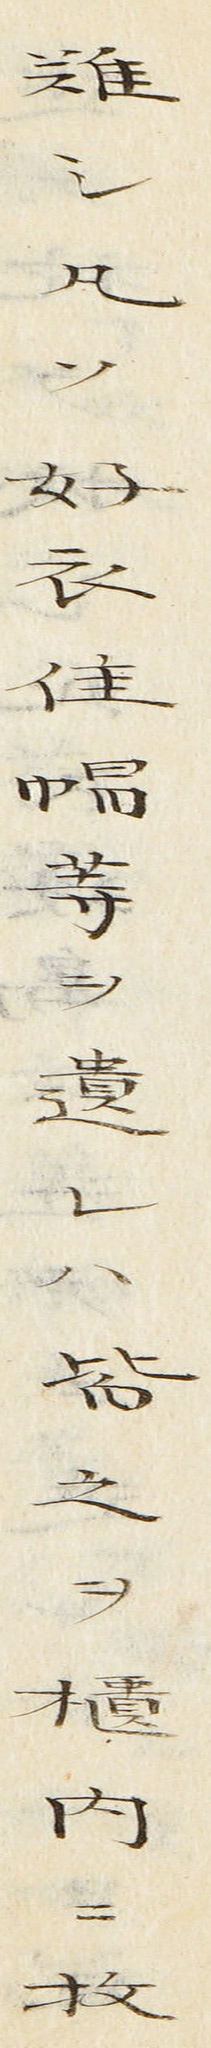難シ凡ソ良衣佳帽等ヲ遺レハ皆之ヲ櫃内ニ枚
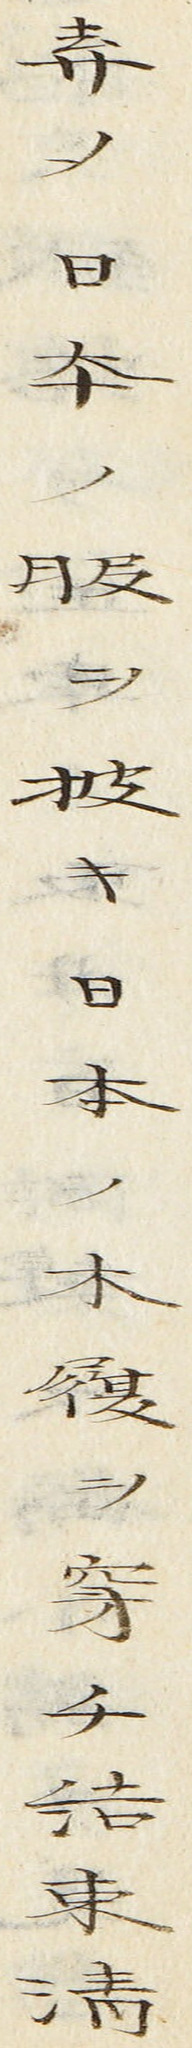弆シテ日本ノ服ヲ披キ日本ノ木履ヲ穿チ結束清
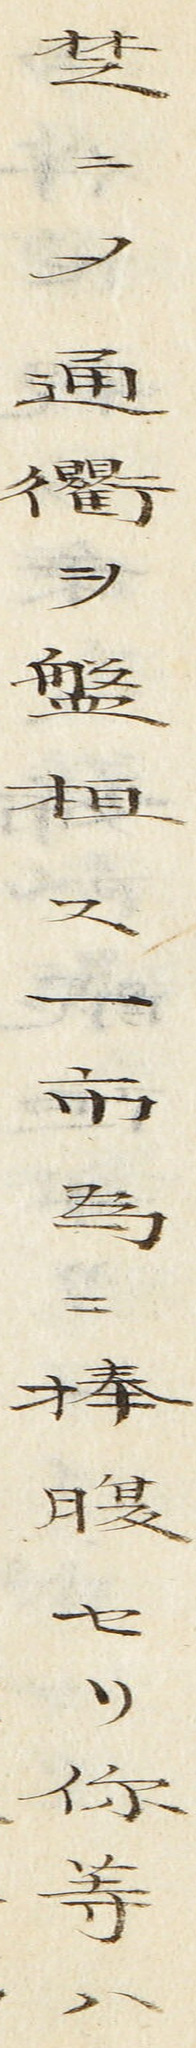楚ニシテ通衢ヲ盤桓ス一市為ニ捧腹セリ你等ハ
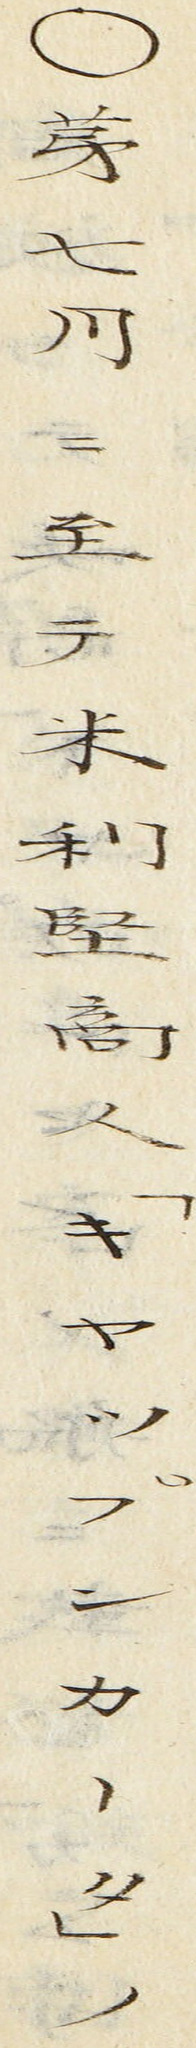○第七月ニ至テ米利堅商人「キヤツプンカータ」ノ

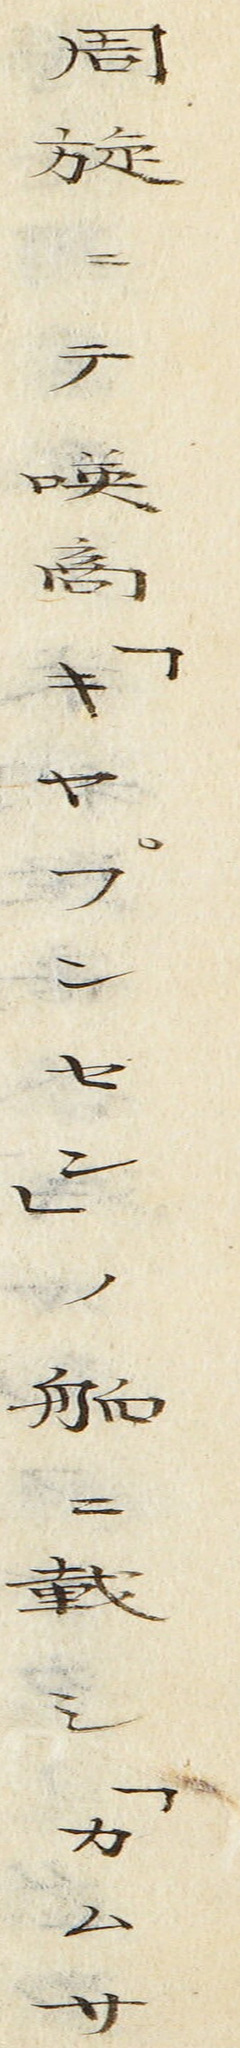周旋ニテ𠸄商「キヤプンセン」ノ舶ニ載シ「カムサ
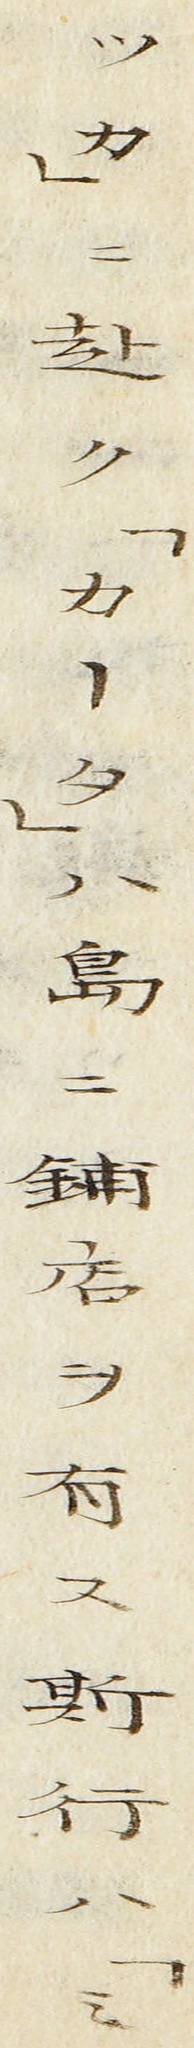ツカ」ニ赴ク「カータ」ハ島ニ鋪店ヲ有ス斯行ハ「ミ
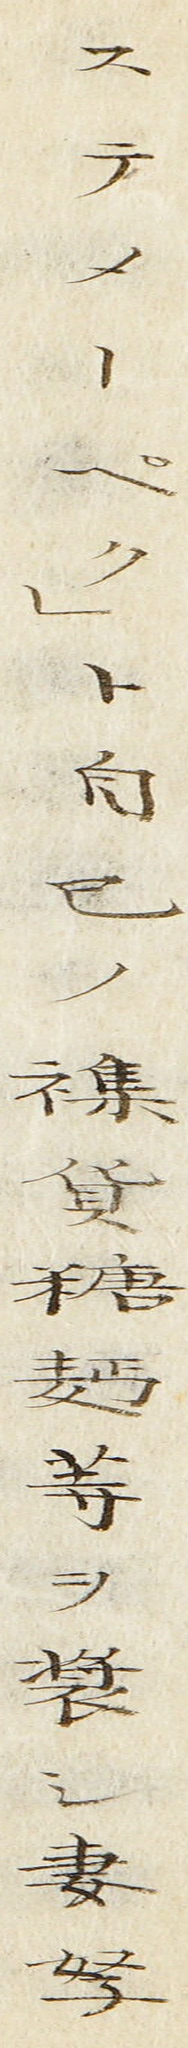ステメーペク」ト自己ノ雑貨糖麺等ヲシ妻孥
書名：蕃談
